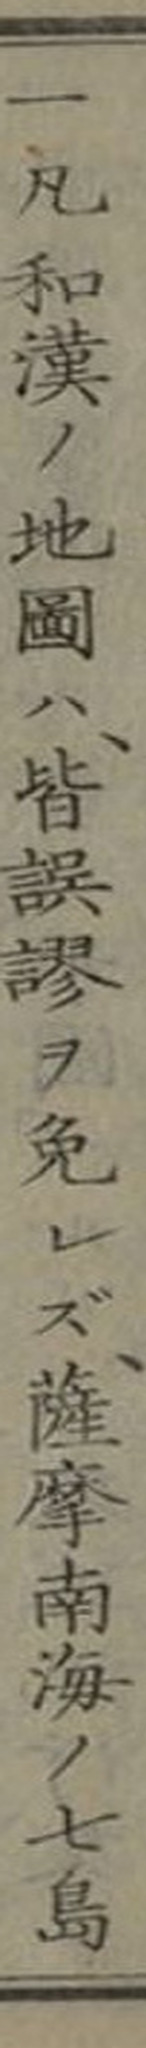一凡和漢ノ地図ハ、皆誤謬ヲ免レズ、薩摩南海ノ七島
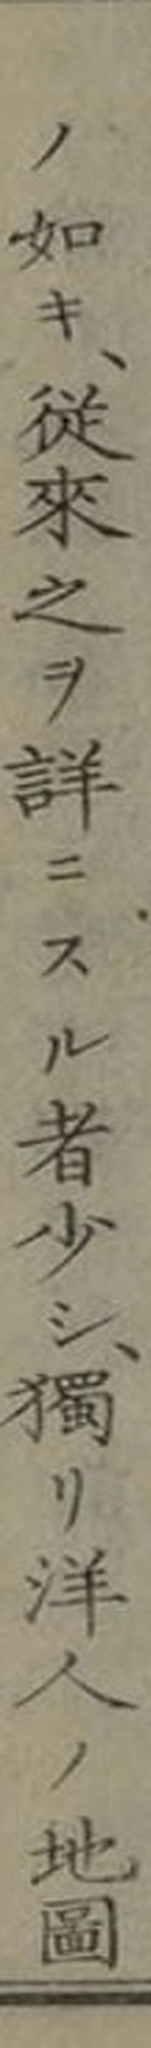ノ如キ、従来之ヲ詳ニスル者少シ、独リ洋人ノ地図
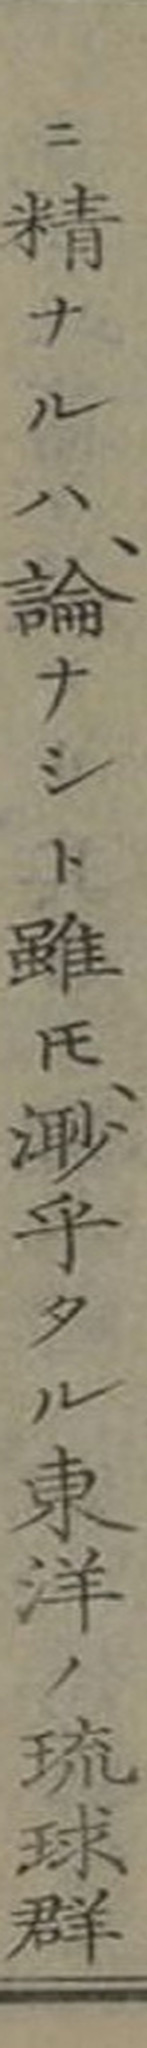ニ精ナルハ、論ナシト雖トモ、渺乎タル東洋ノ琉球群
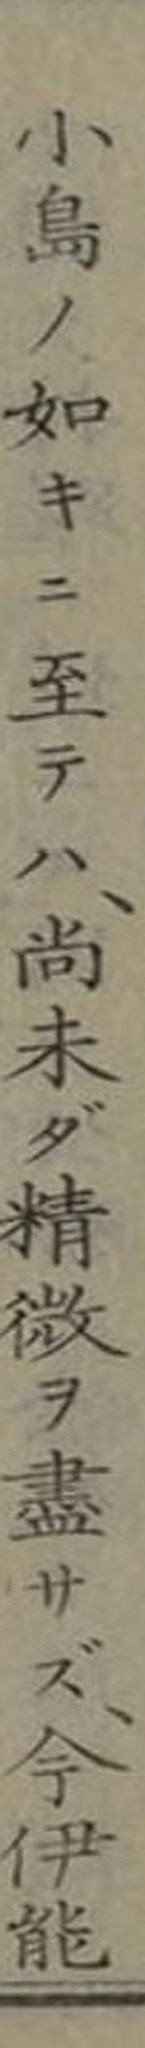小島ノ如キニ至テハ、尚未ダ精微ヲ尽サズ、今伊能
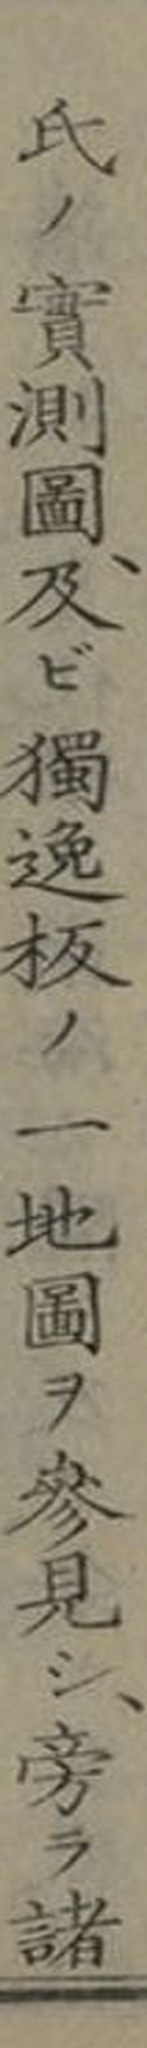氏ノ実測図、及ビ独逸板ノ一地図ヲ参見シ、旁ラ諸
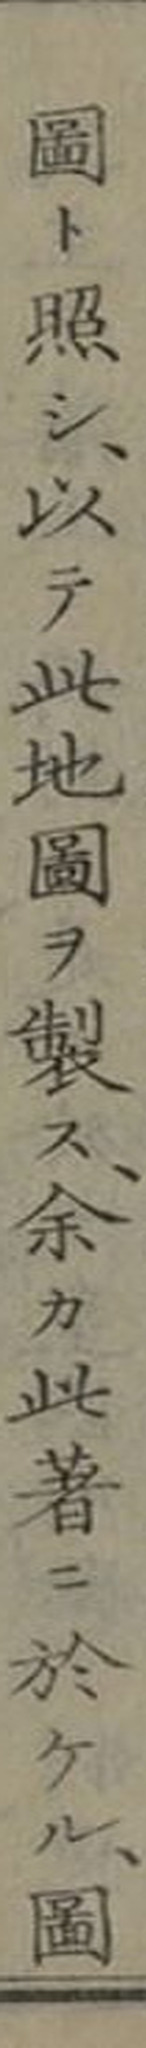図ト照シ、以テ此地図ヲ製ス、余カ此著ニ於ケル、図
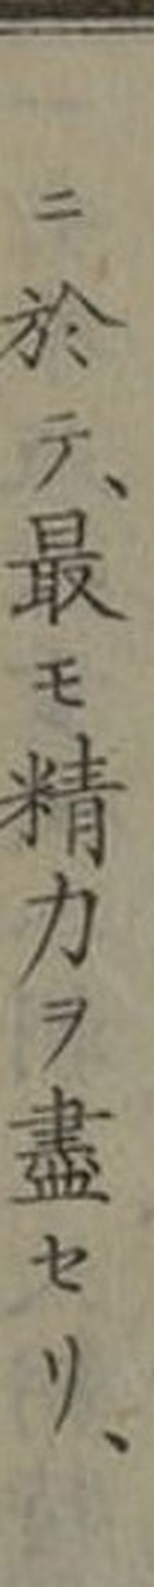ニ於テ、最モ精力ヲ尽セリ、
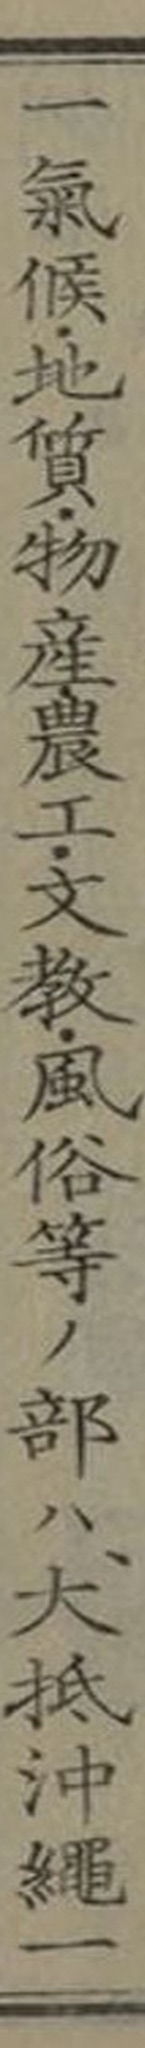一気候・地質・物産・農工・文教・風俗等ノ部ハ、大抵沖縄一
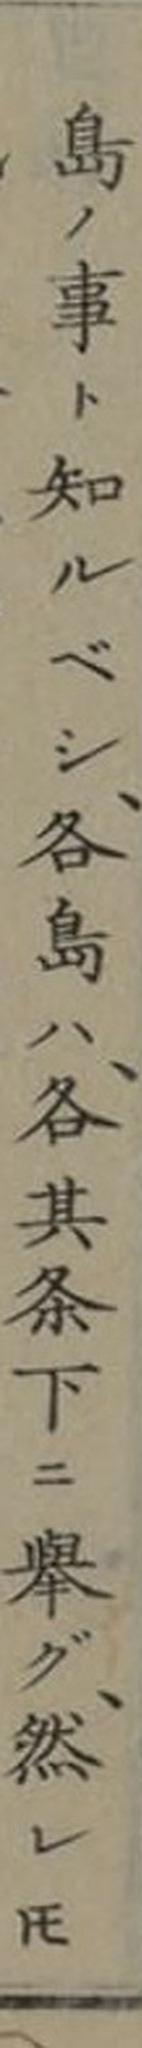島ノ事ト知ルベシ、各島ハ、各其条下ニ挙グ、然レトモ
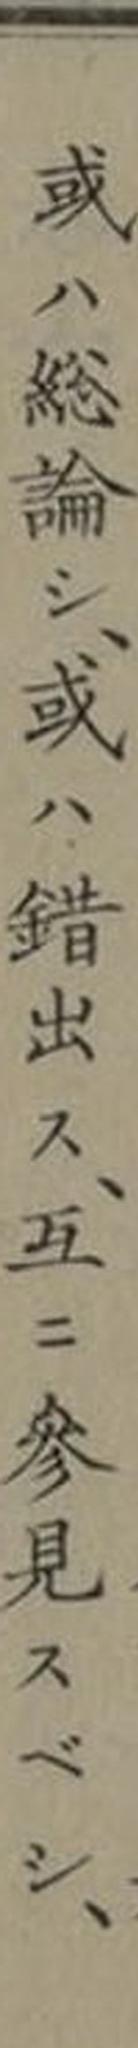或ハ総論シ、或ハ錯出ス、互ニ参見スベシ、
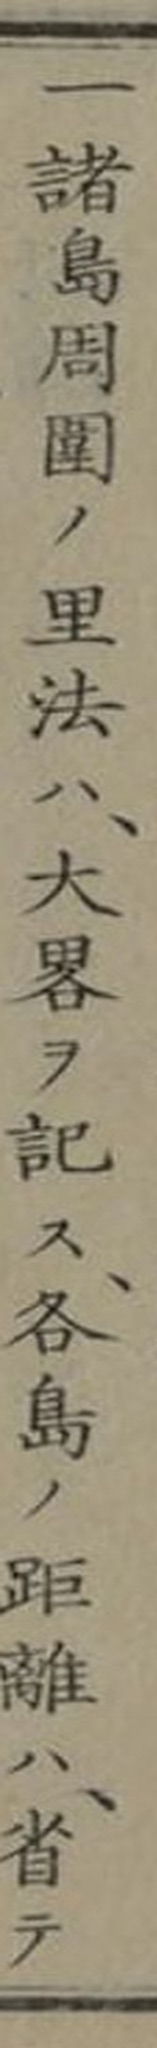一諸島周囲ノ里法ハ、大略ヲ記ス、各島ノ距離ハ、省テ
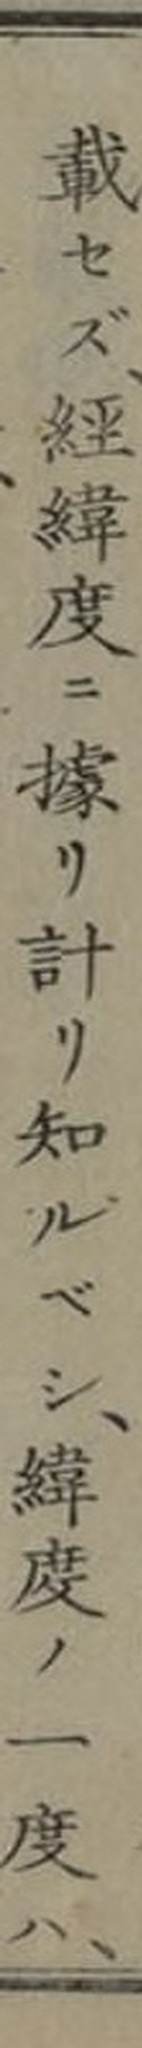載セズ、経緯度ニ拠リ計リ知ルベシ、緯度ノ一度ハ、
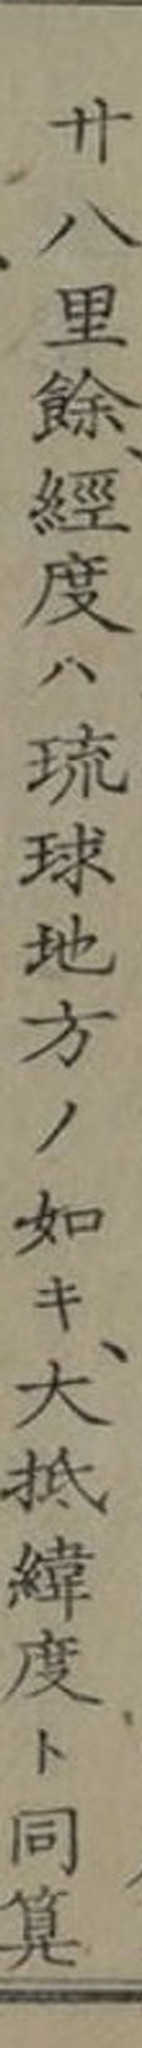廿八里余、経度ハ琉球地方ノ如キ、大抵緯度ト同算
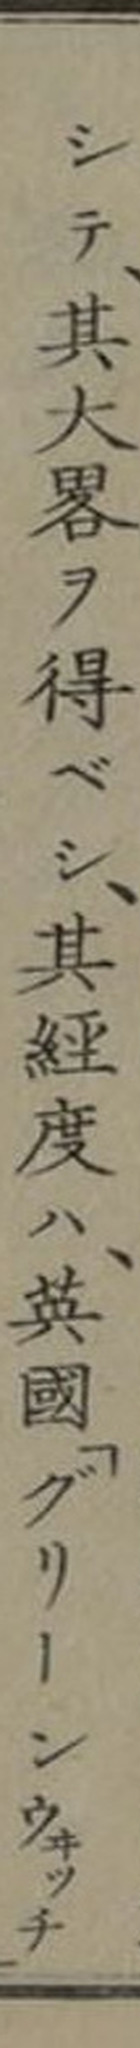シテ、其大略ヲ得ベシ、其経度ハ、英国「グリーンウヰッチ」
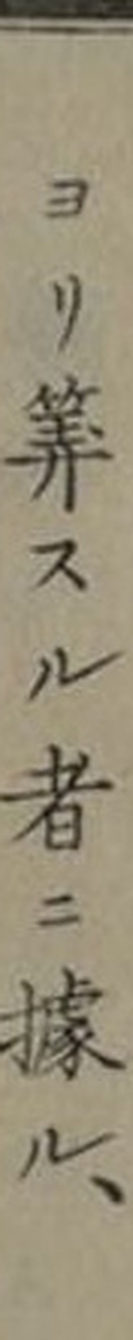ヨリ算スル者ニ拠ル、
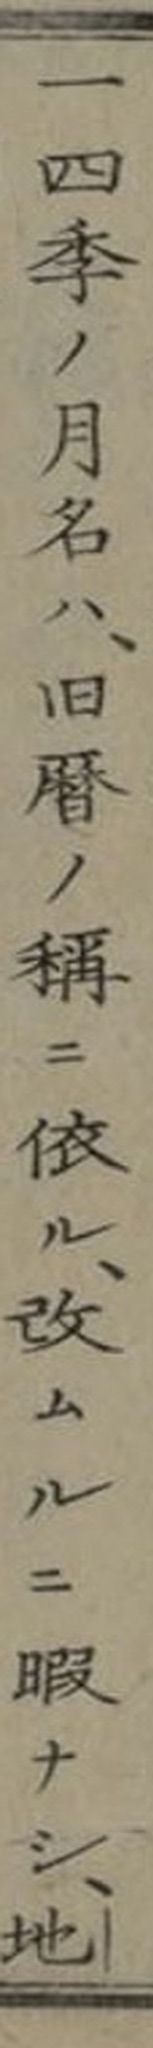一四季ノ月名ハ、旧暦ノ称ニ依ル、改ムルニ暇ナシ、地
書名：琉球新誌 図附 上
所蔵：University of the Ryukyus Library
